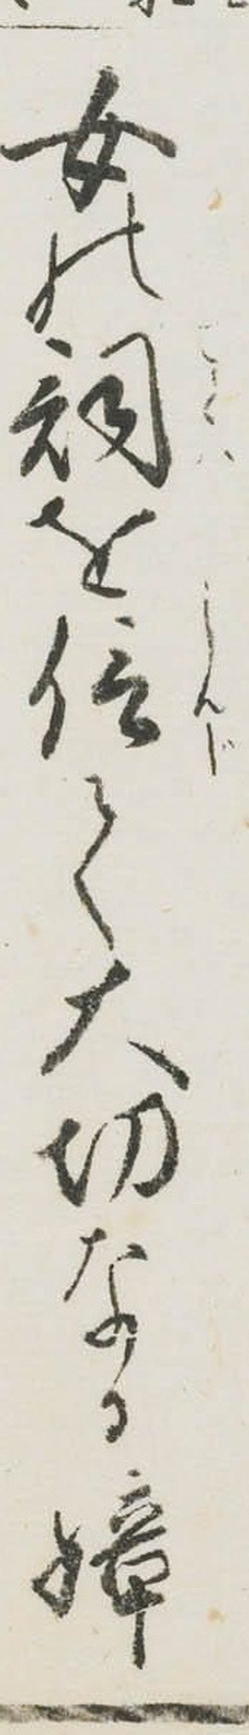女の詞を信て大切なる嫜
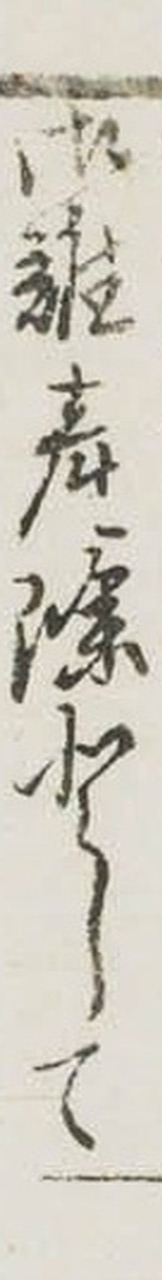御難産除として
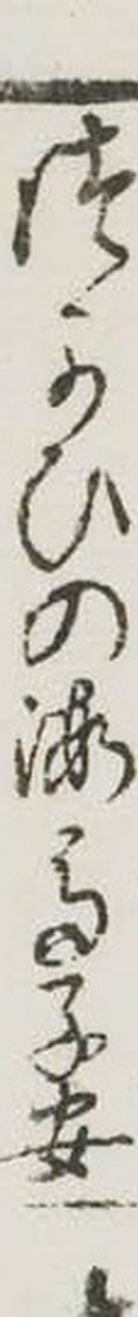つかひの海馬子安
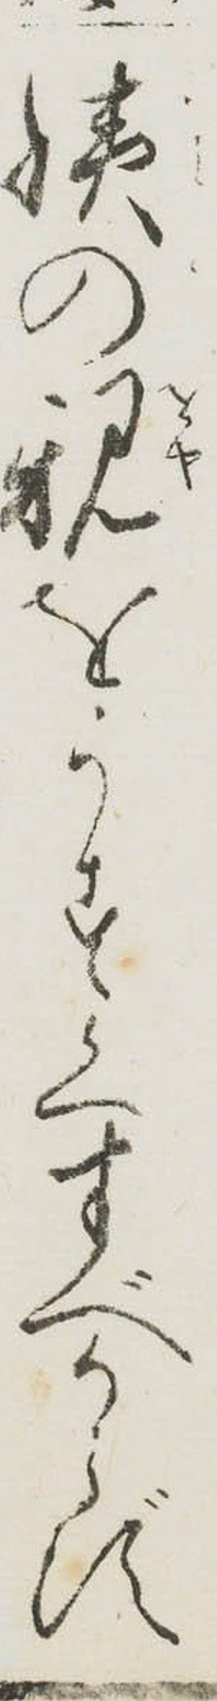姨の親をうすくすべからず
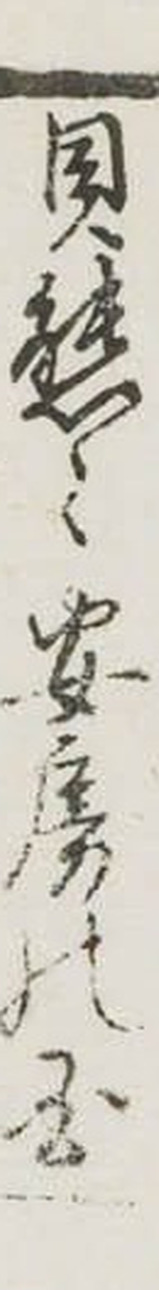貝態々安房の国
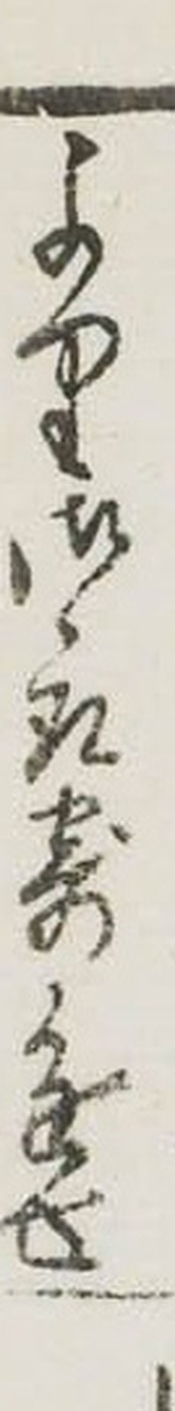より御取寄進せ
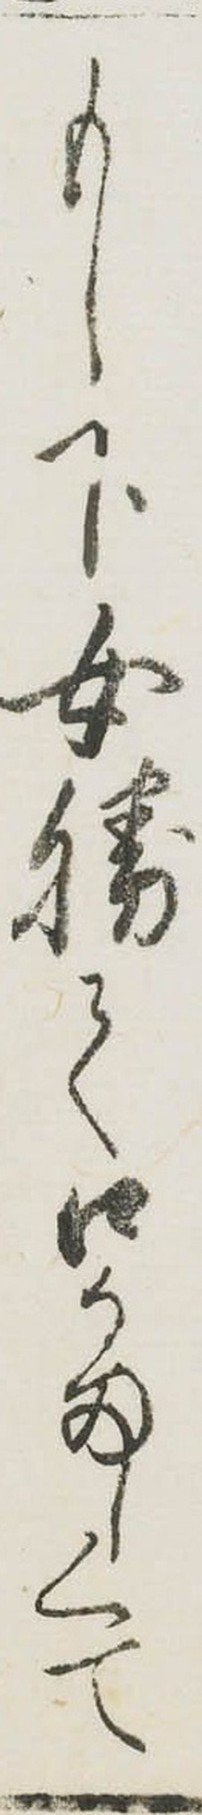もし下女勝て口かましくて
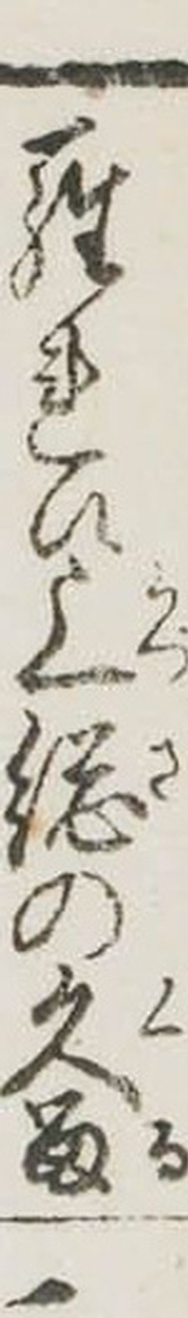られ候上総の久留
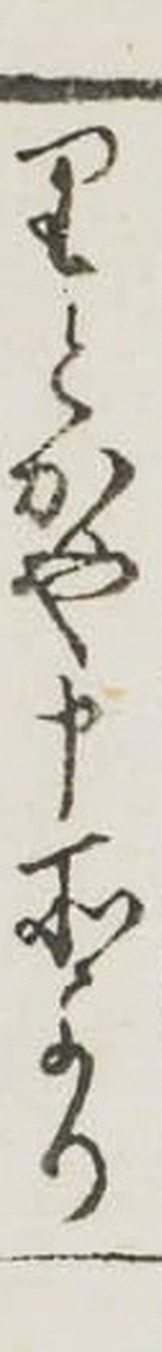里とかや申所より
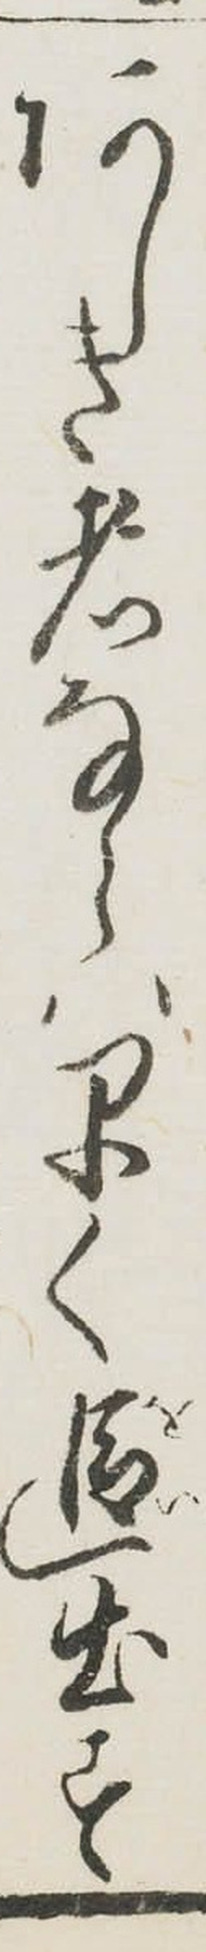あしき者ならは早く追出す
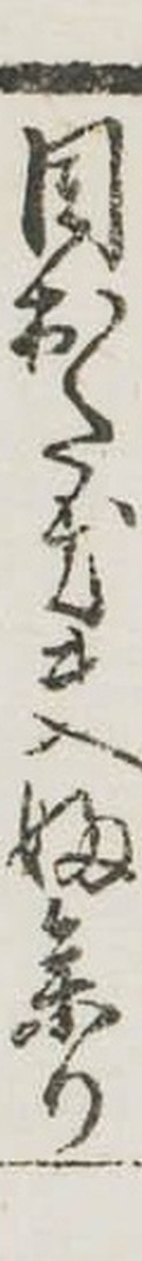目出たき夫婦参り
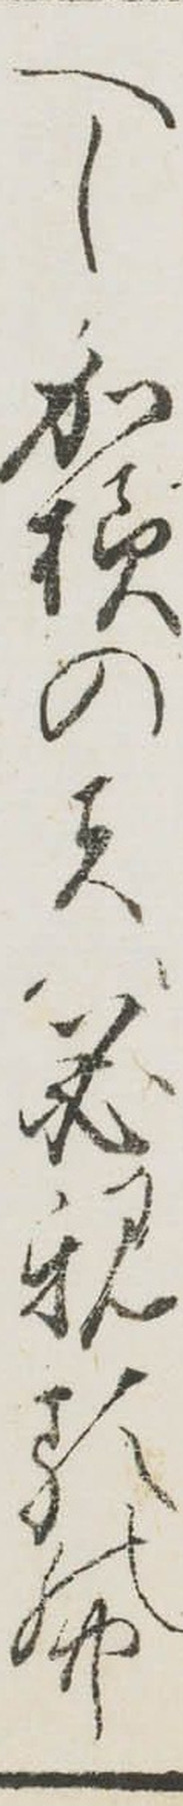へしか様の者は必親類の中
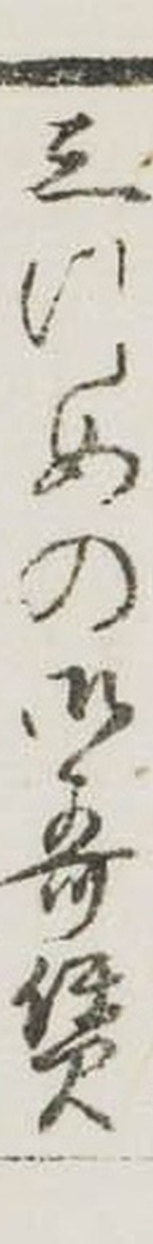三つめの御哥賃
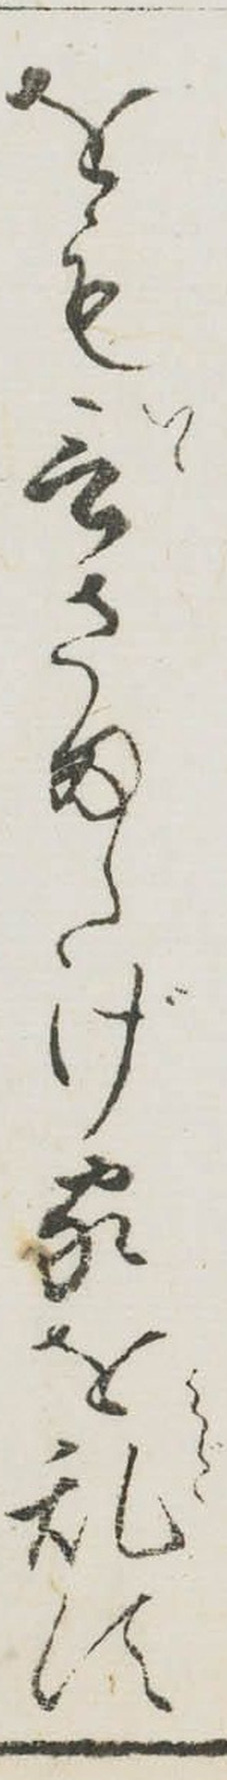をも言さまたげ家を乱す
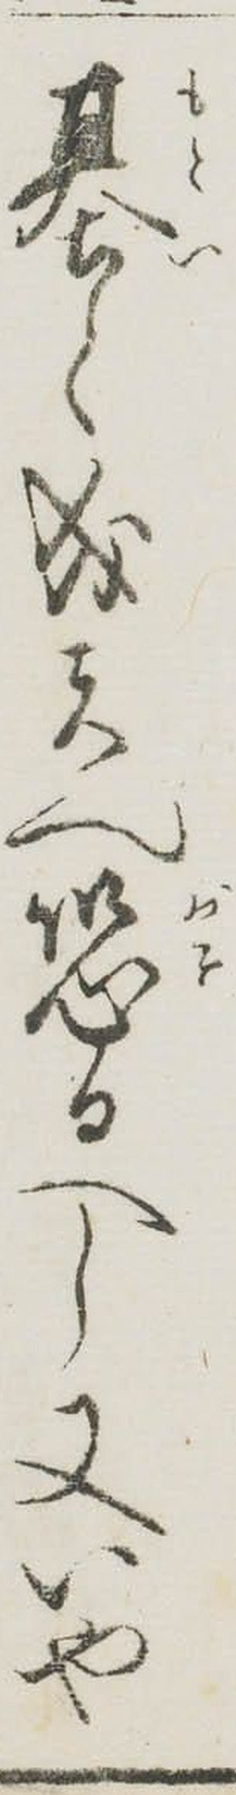基と成者也恐るへし又いや
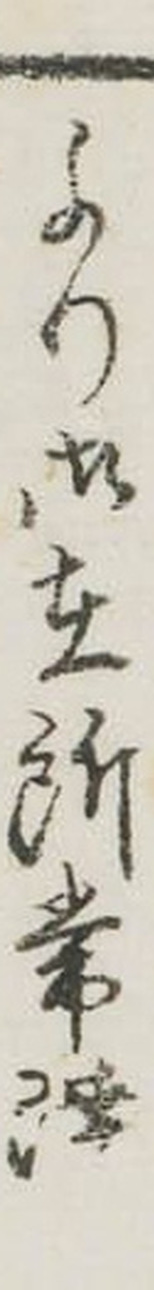より御在所常陸
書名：女大学
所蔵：東京学芸大学教育コンテンツアーカイブ
